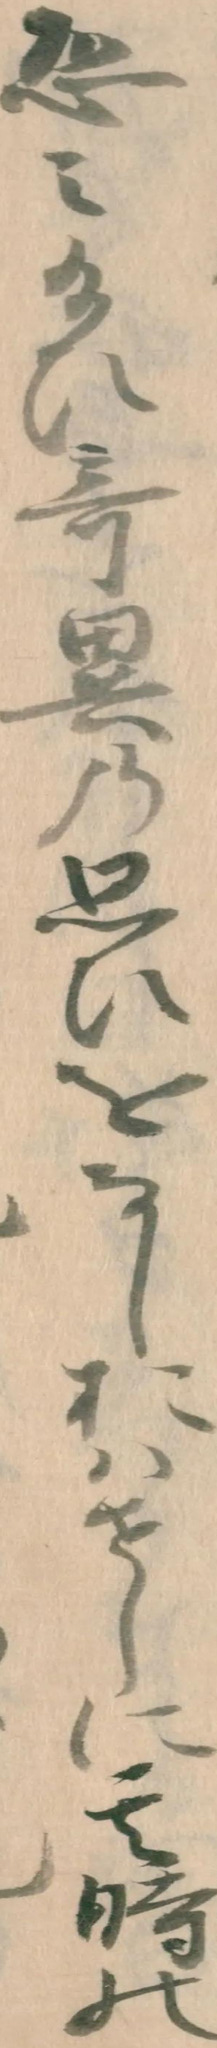恐み給ひ奇異の思ひをなしおはせしに其時の
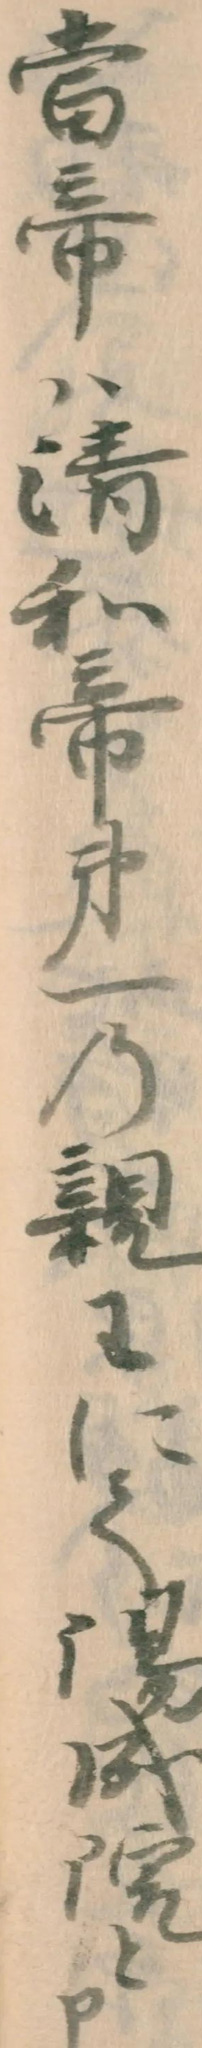当帝は清和帝第一の親王にて陽成院と申
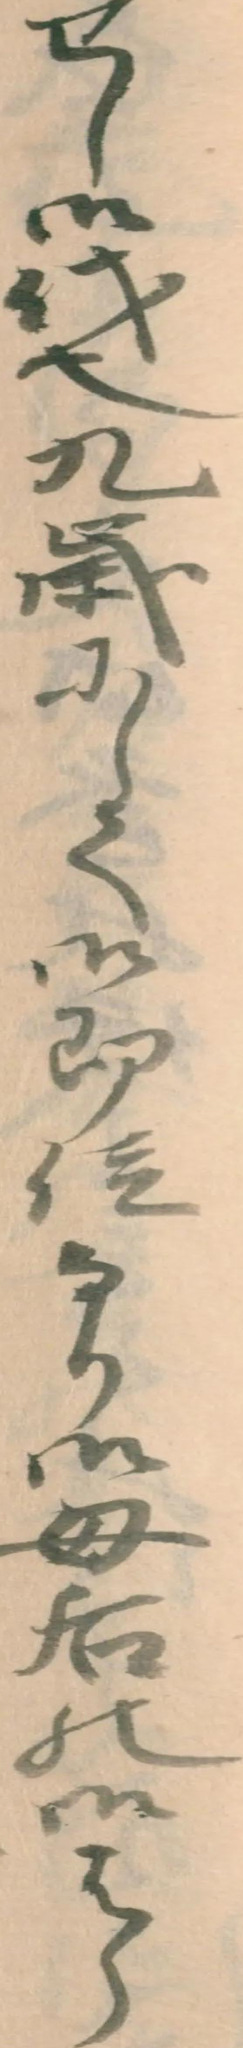せし御代也九歳にして御即位なり御母后御はら
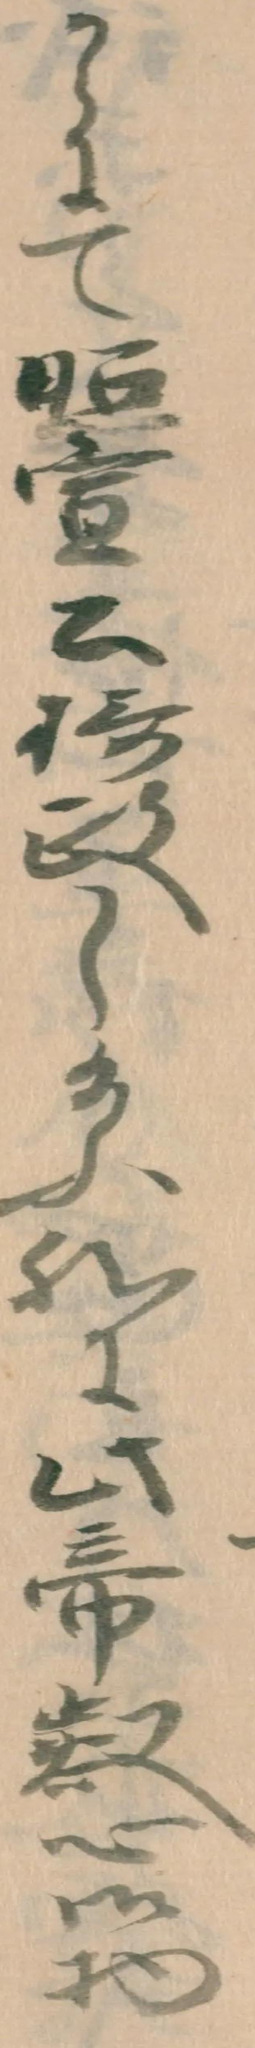からにて昭宣公摂政し給ふ然に此帝叡心御物
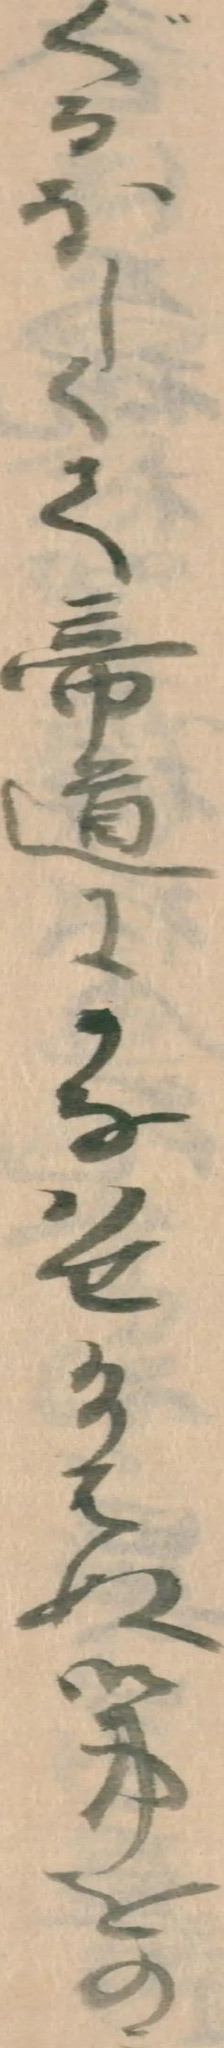ぐるほしくて帝道にかなはせ給はぬ御事をのみ
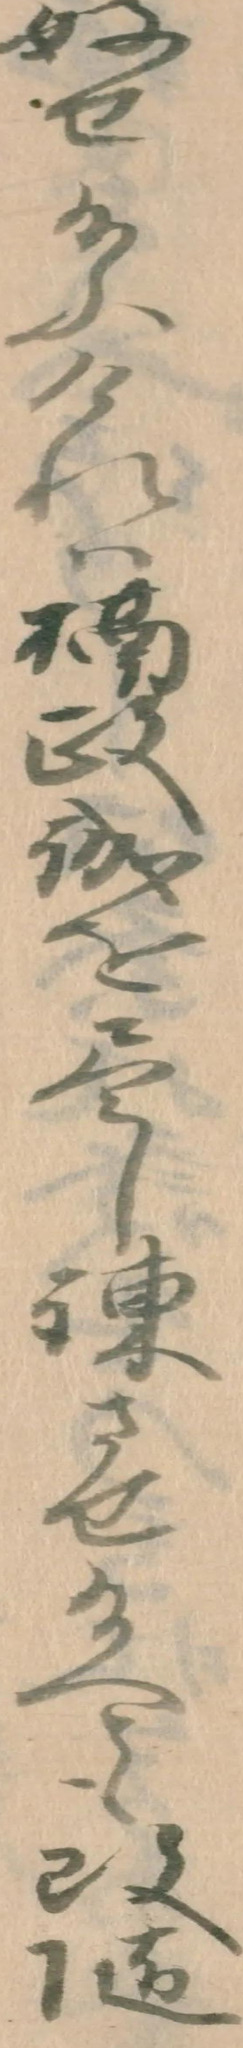好せ給ふけれは摂政誠を尽し諌させ給へとも改随
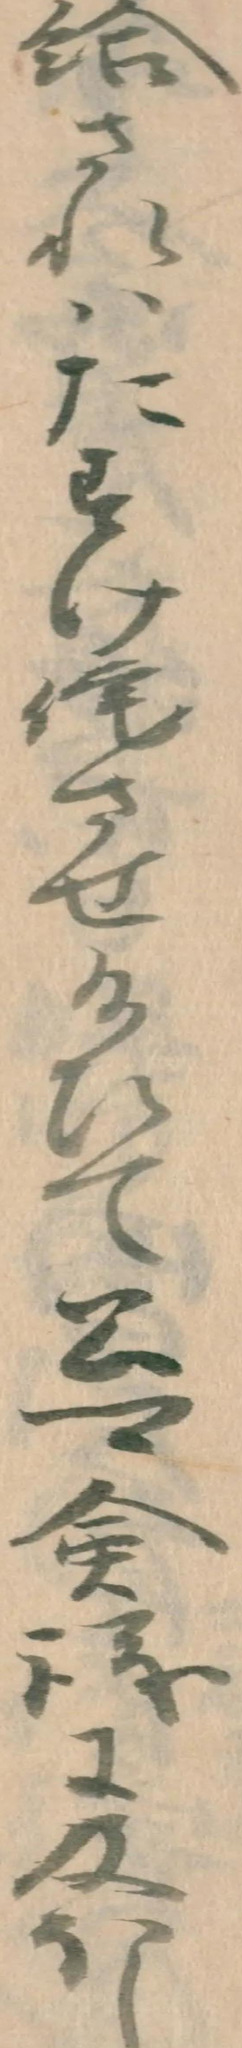給されはたすけ侘させ給ひて公卿僉議に及ほし
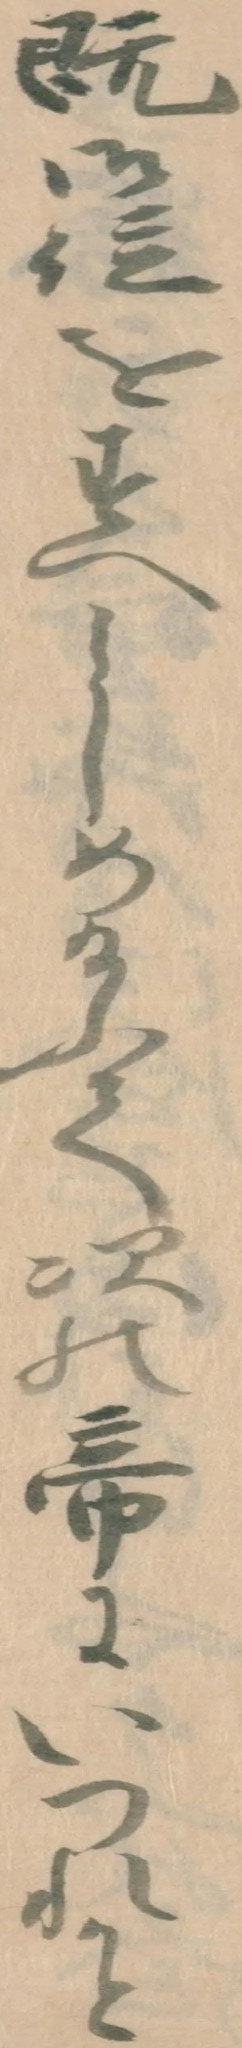既御位をすへらしめ給ふて次の帝にいつれかと
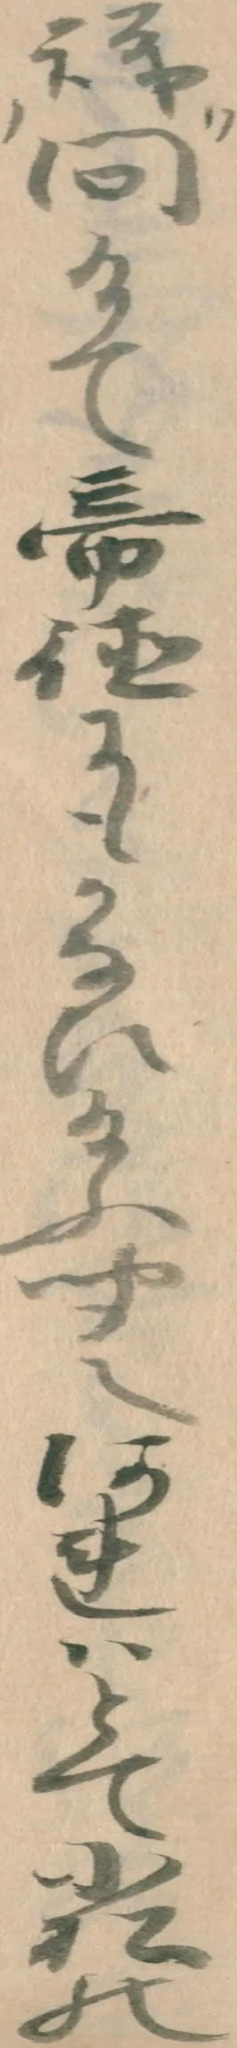議-問給て帝徳にもかなひ給ふ聞えあれはとて小松の
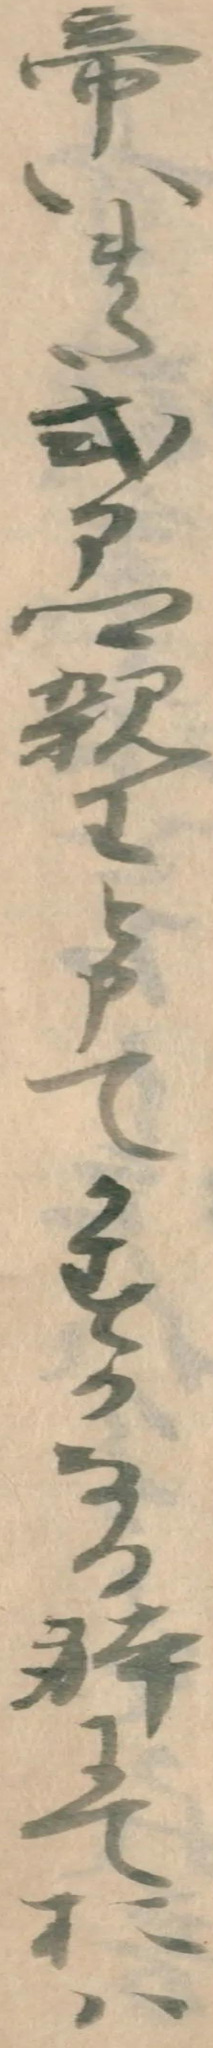帝いまた式部卿親王と申てかすかなる躰にておは
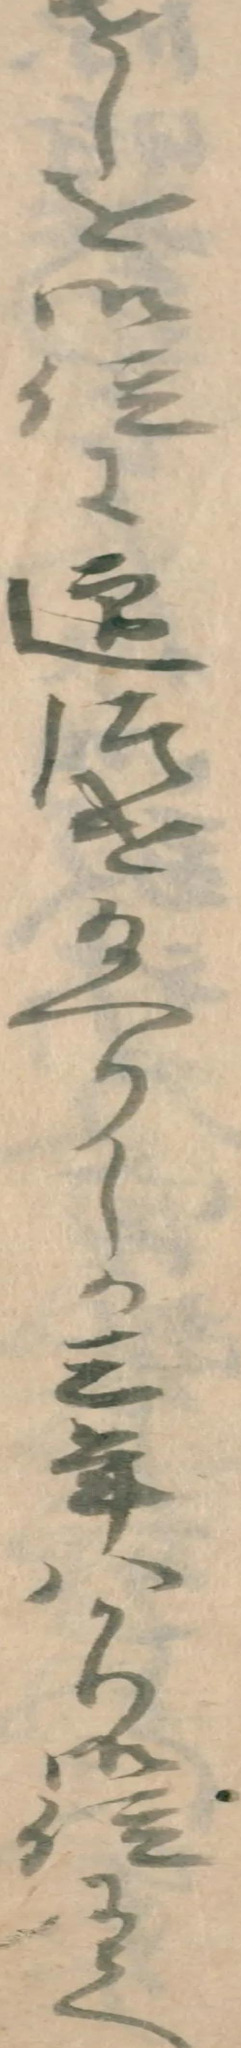せしを御位に迎つけ給へりしか三年はかり御位にて
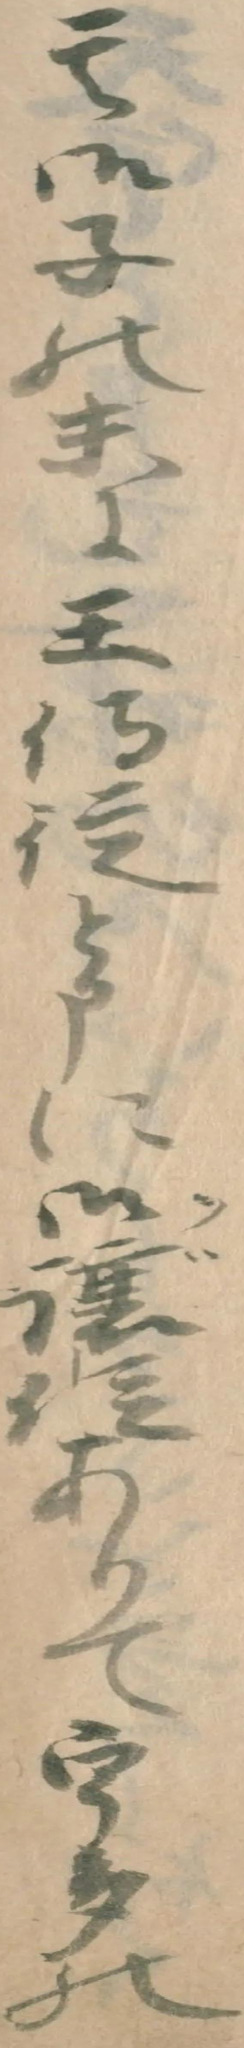其御子の末に王侍従と申に御譲-位ありて宇多の

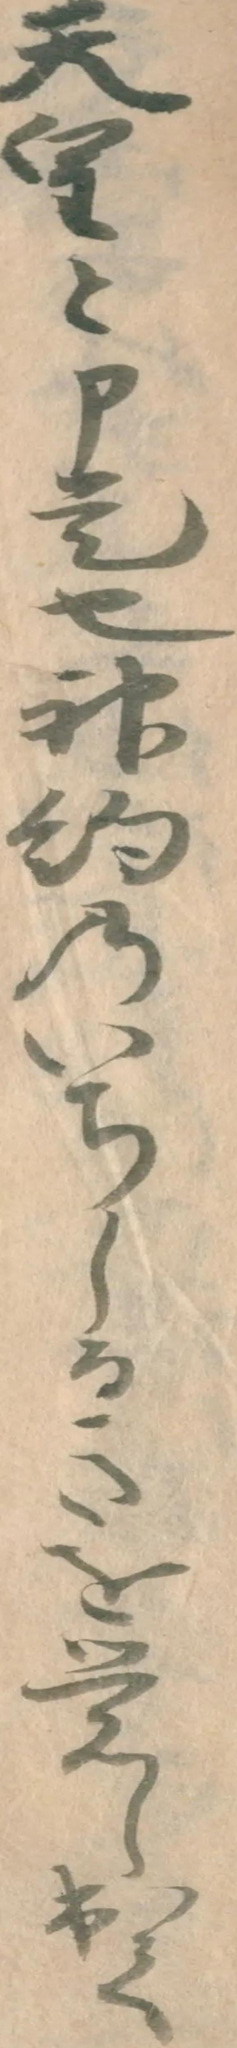天皇と申是也神約のいちしるきを覚し出て
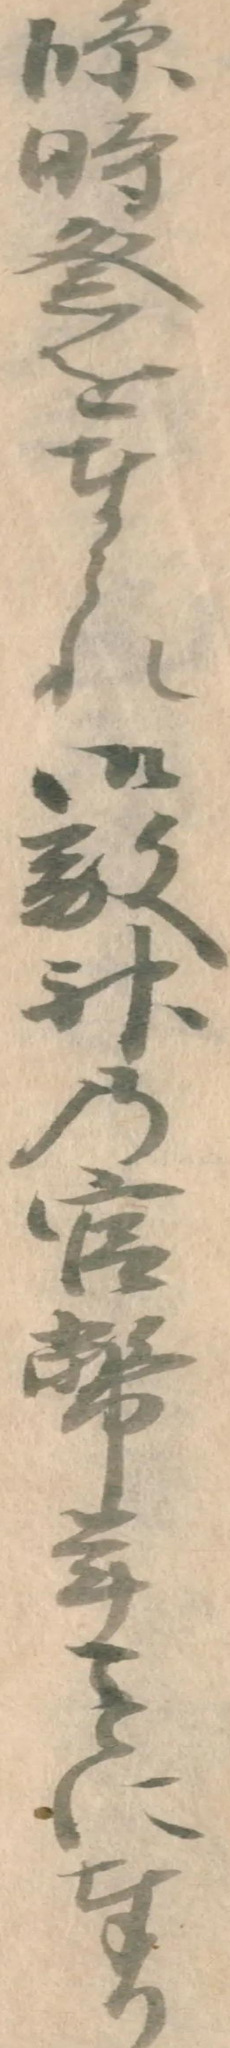臨時祭を奉られ御敬神の官幣年ことに奉り
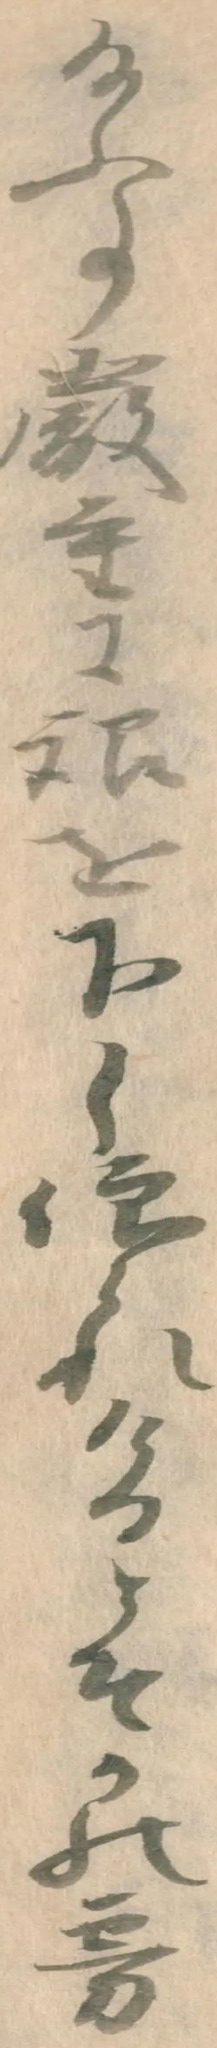給ふ事厳重に詔を下し仰られけるとそかの霧
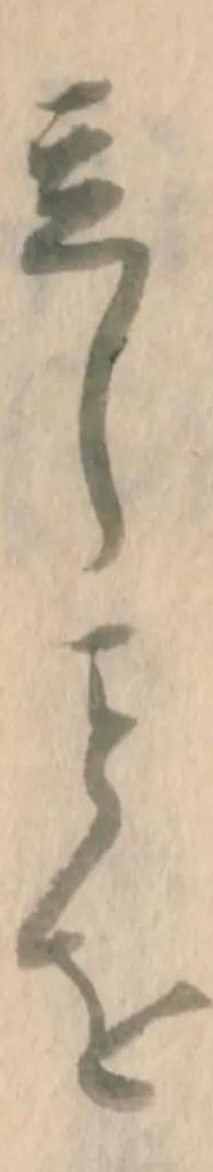立しことを
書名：賀茂社記録. 第1冊
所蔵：国立国会図書館 National Diet Library, JAPAN
